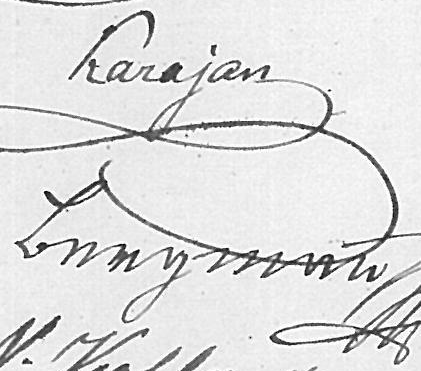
Bergmann
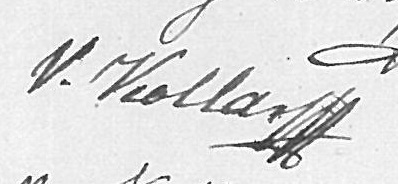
V. Kollar
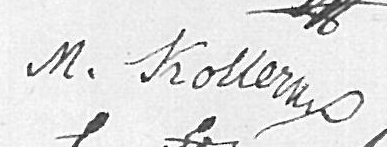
M. Koller
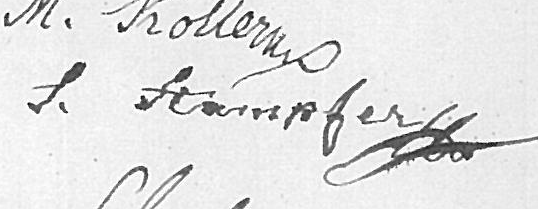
S. Stampfer
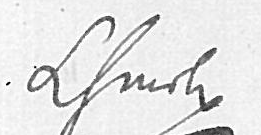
Chmel
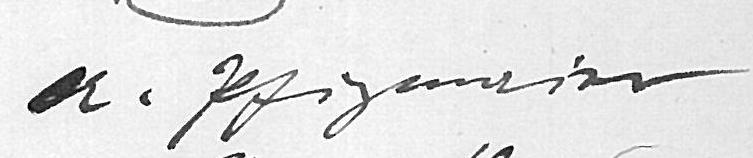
A. Pfizmaier
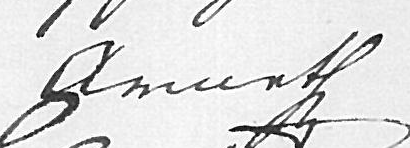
Arneth
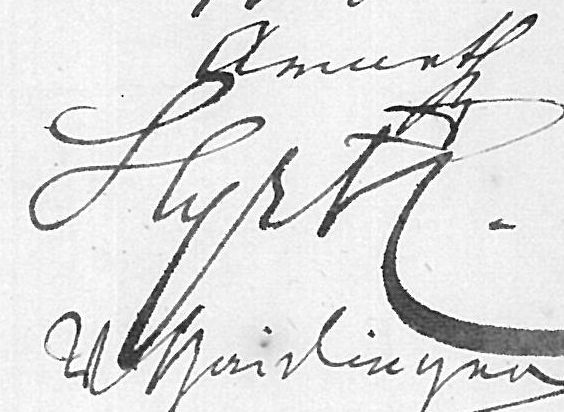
Hyrtl
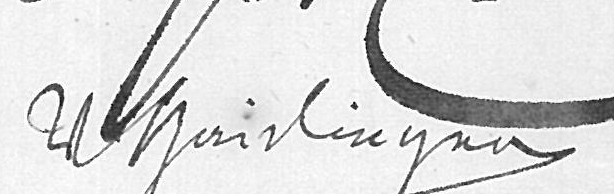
W. Haidinger
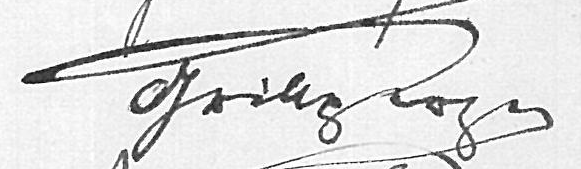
Grillparzer
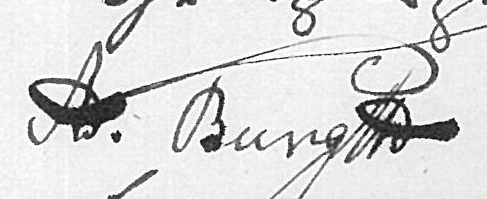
A. Burg
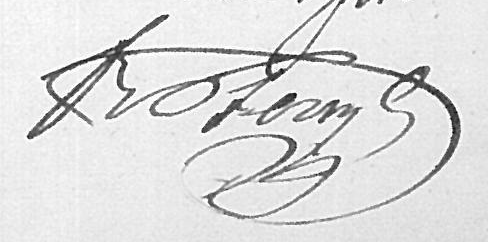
Ed Fenzl
